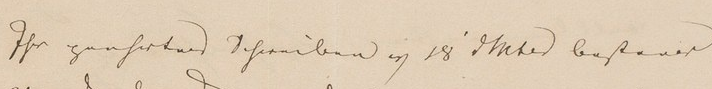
Ihr geehrtes Schreiben vom 18t dMts bestens
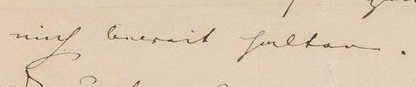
mich bereit halten.
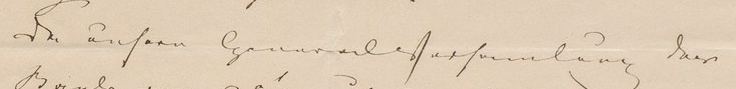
Da unsere GeneralVersamlung der
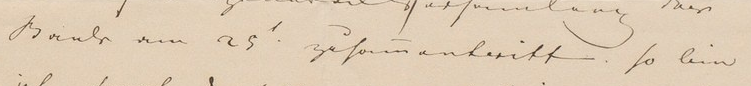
Bank am 25t zusammentritt – so bin
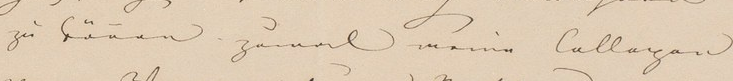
zu können – zumal meine Collegen
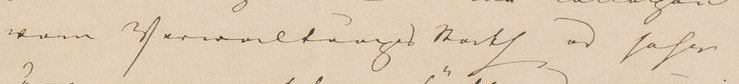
vom Verwaltungs Rath es sehr
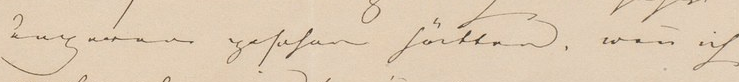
ungerne gesehen hätten, wenn ich
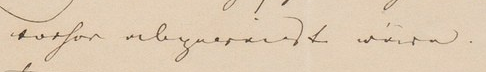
vorher abgereist wäre. –
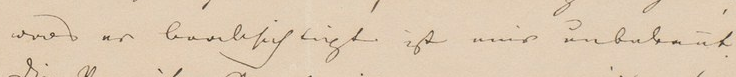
was er beabsichtig ist mir unbekannt.
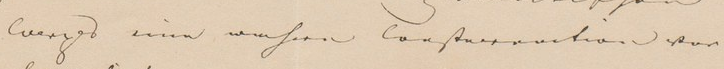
Corps eine wahre Consternation ver-
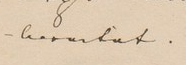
breitet.
